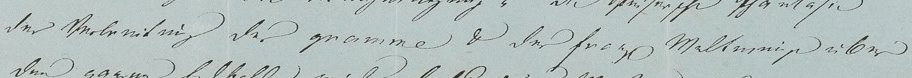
der Verbreitung des gramme & der franz. Weltmünze über
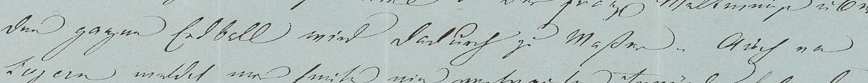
den ganzen Erdball wird dadurch zu Waßer. Auch von
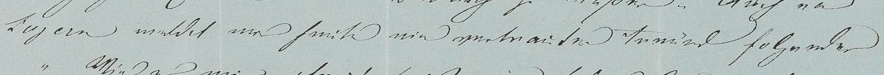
Luzern meldet mir heute ein vertrauter Freund folgendes
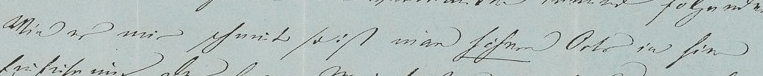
«Wie es mir scheint so ist man höhern Orts in hier
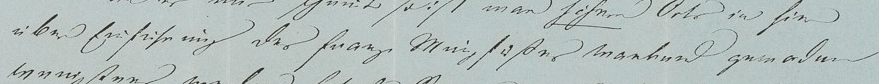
über Einführung des franz. Münzfußes wankend geworden
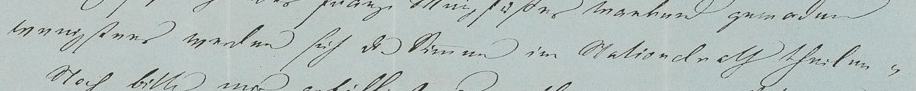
wenigstens werden sich die Stimmen im Nationalrath theilen»
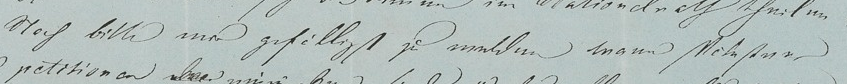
Noch bitte mir gefälligst zu melden wann spätestens
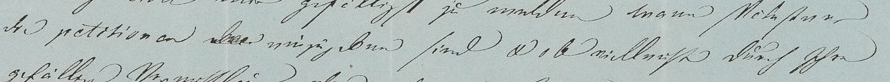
die petitionen einzugeben sind & ob vielleicht durch Ihre
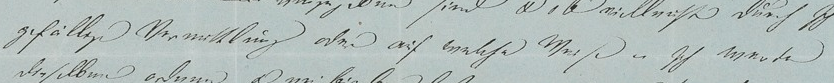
gefällige Vermittlung oder auf welche Weise. Ich werde
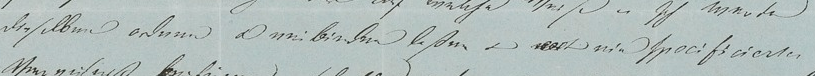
dieselben ordnen & einbinden laßen & ein specificiertes
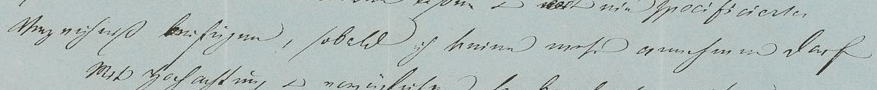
Verzeichniß beifügen, sobald ich keine mehr annehmen darf
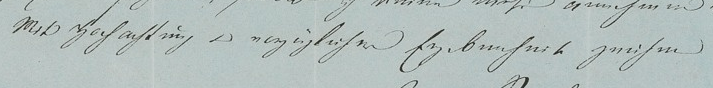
Mit Hochachtung & vorzüglicher Ergebenheit zeichne
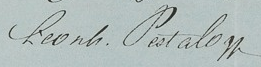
Leonh. Pestalozzi
